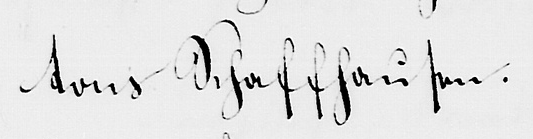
tons Schaffhausen.
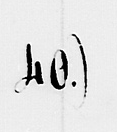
40.)
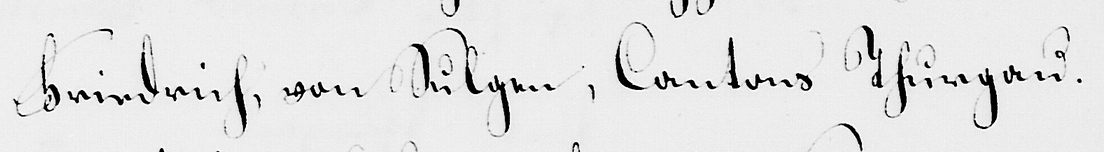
Friedrich, von Sulgen; Cantons Thurgau.
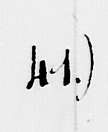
41.)
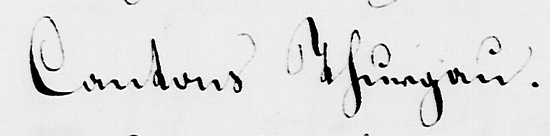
Cantons Thurgau.
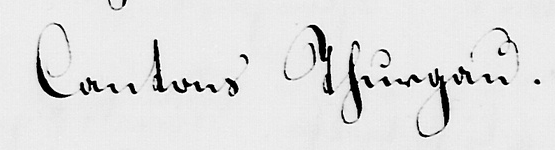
Cantons Thurgau.
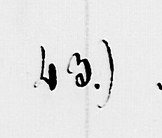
43.)
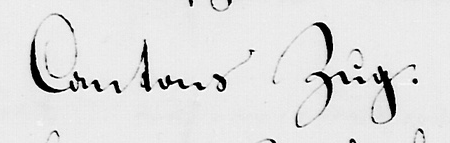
Cantons Zug.
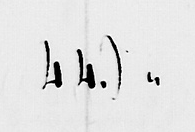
44.)
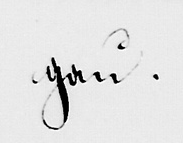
gau.
